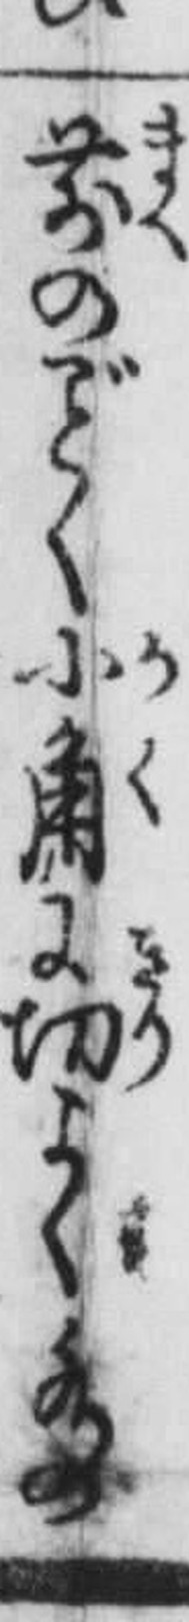前のごとく小角に切よく水の
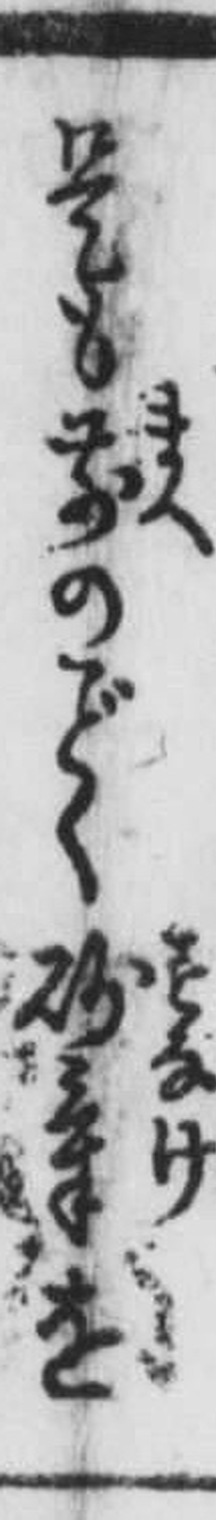是も前のごとく砂気を
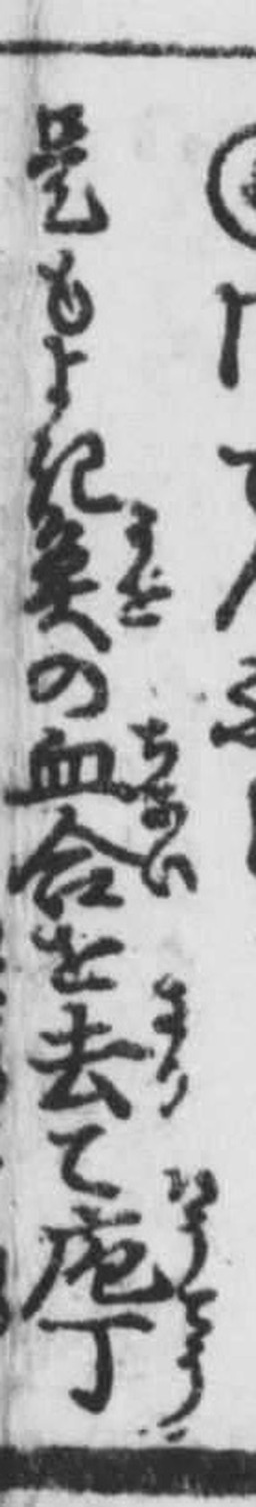是もよき魚の血合を去て庖丁
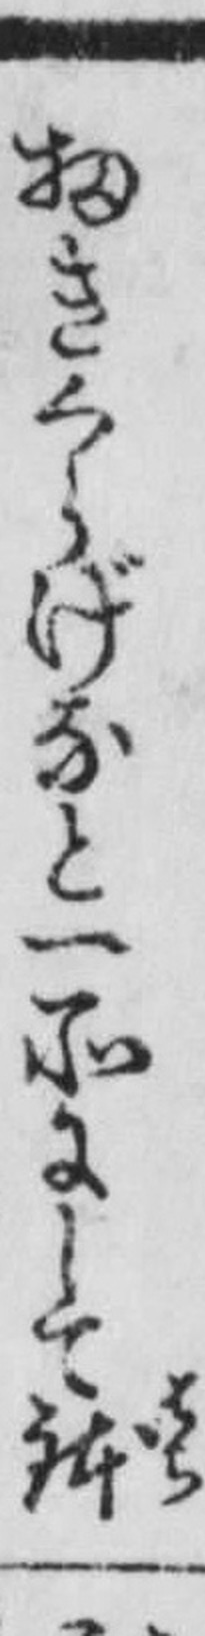扨きくらげなと一所にして鉢
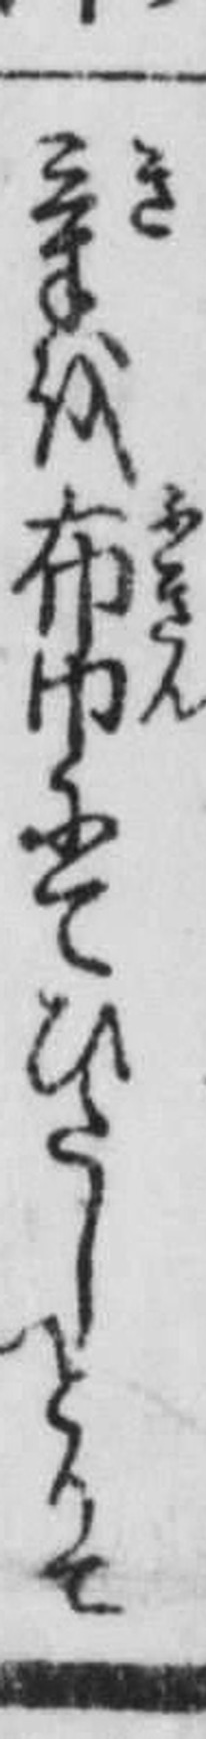気を布巾にてひたしとりて
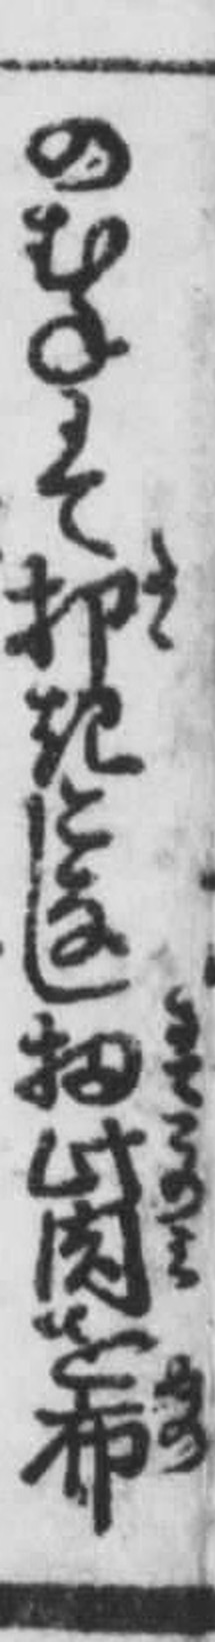のむねにて叩きこなし扨此肉を布
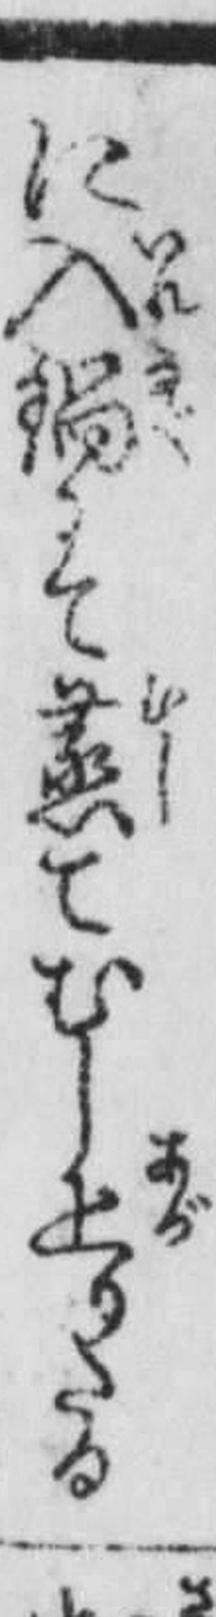に入鍋にて蒸てむし上りたる
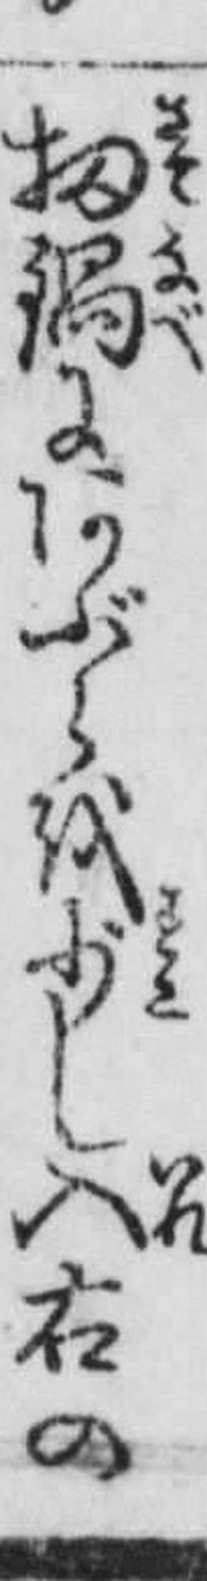扨鍋にあぶらを少し入右の
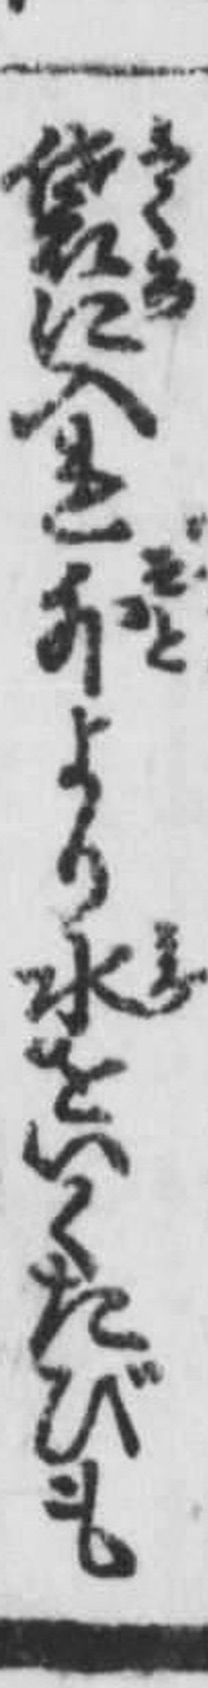袋に入れ外より水をいくたびも
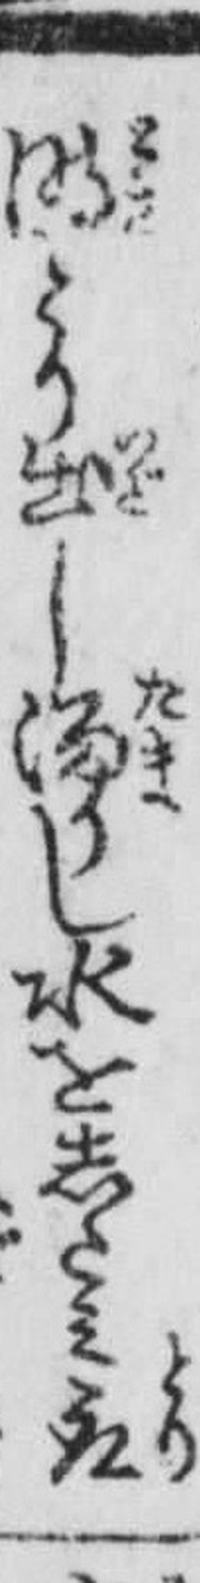時とり出し溜りし水をしたみ取
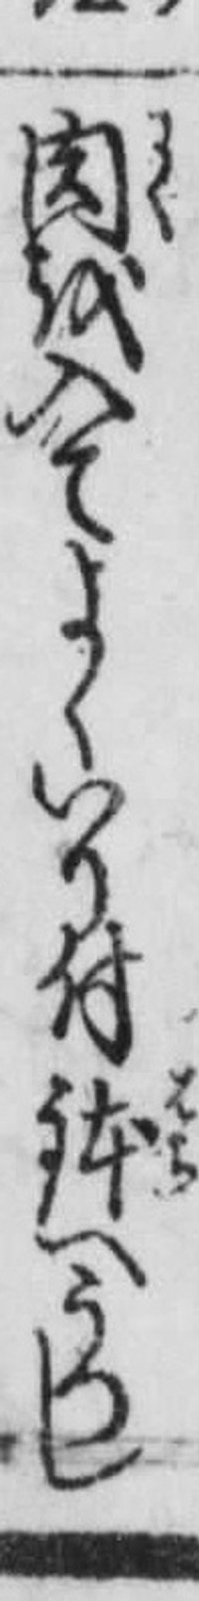肉を入てよくいり付鉢へうつし
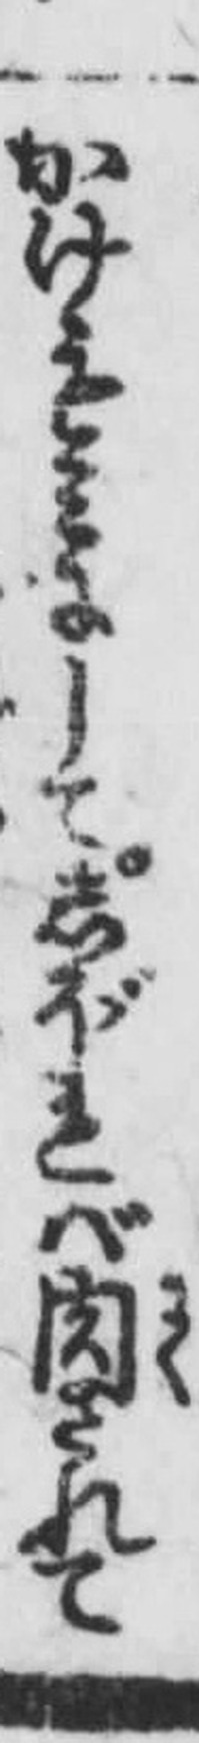かけもみにしてしぼれば肉されて
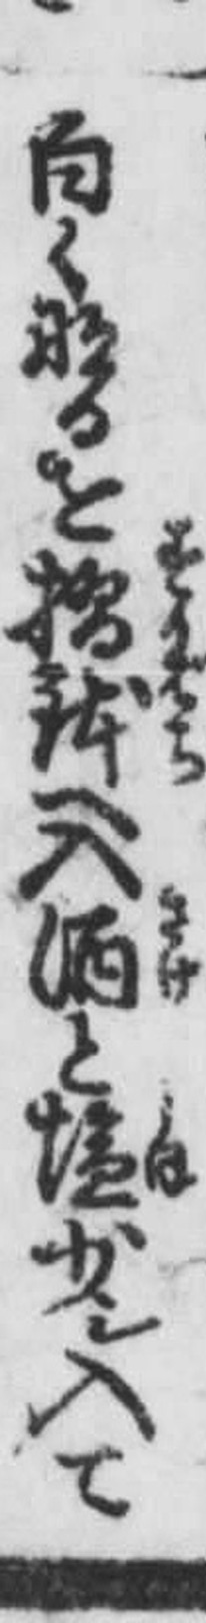白くなるを摺鉢へ入酒と塩少し入て

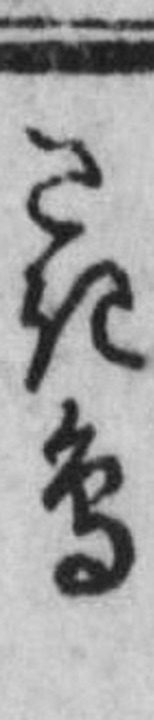さき鳥
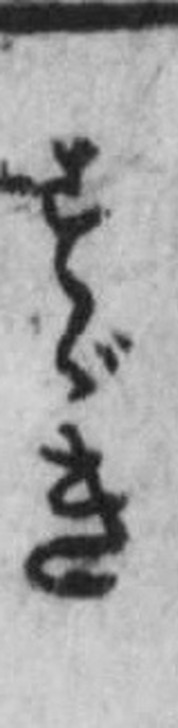すゞき
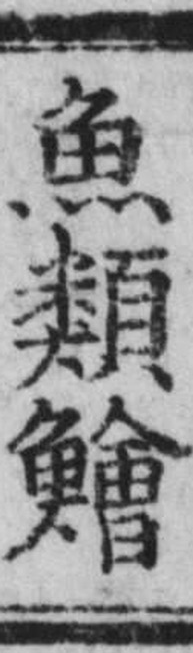魚類鱠
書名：精進魚類間合料理/早速庖丁
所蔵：大阪府立大学学術情報センター 国文学研究資料館
